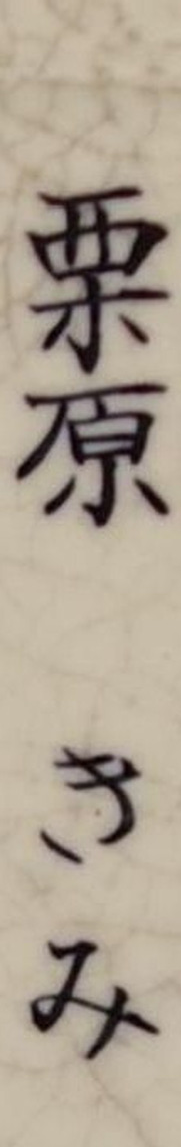栗原きみ
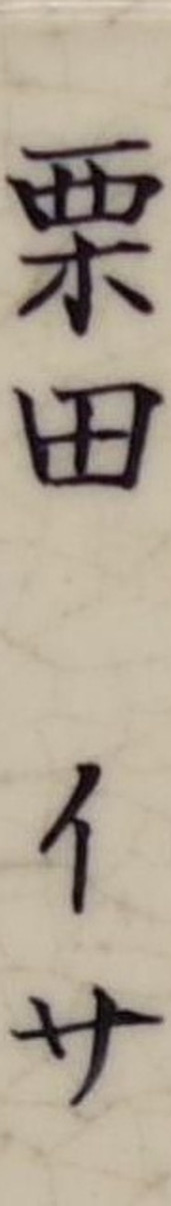栗田イサ
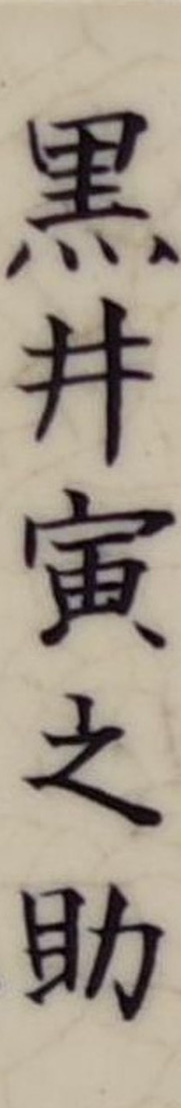黒井寅之助
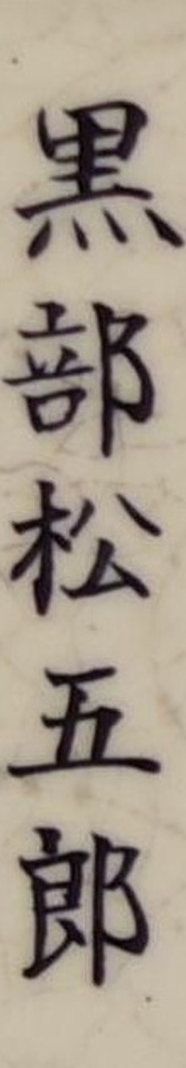黒部松五郎
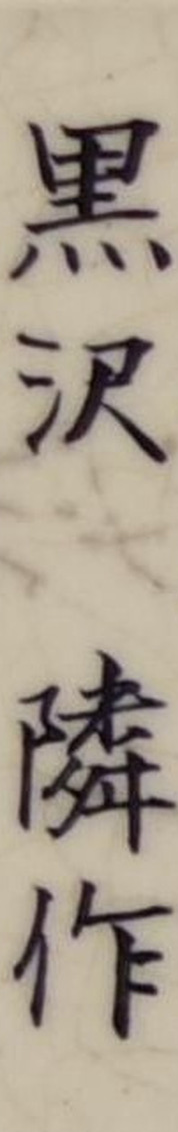黒沢隣作
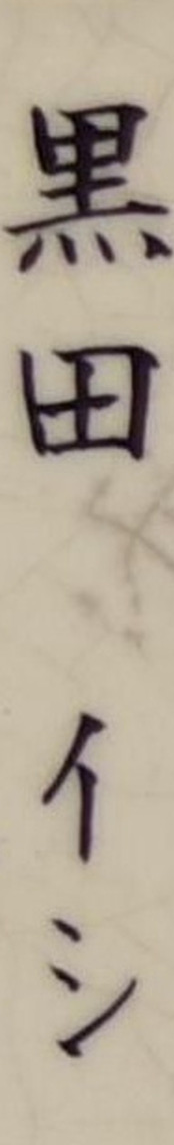黒田イシ
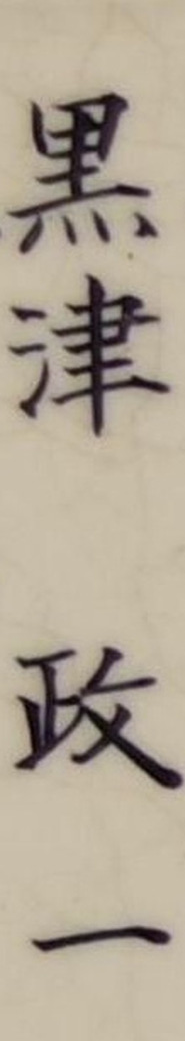黒津政一
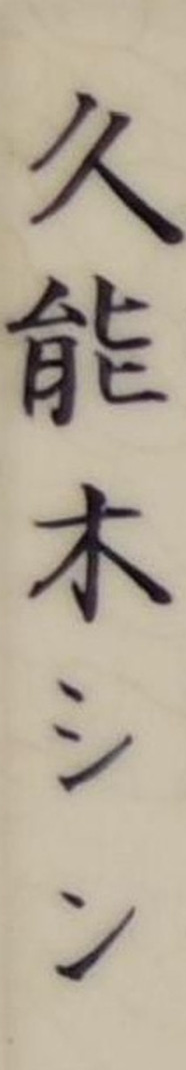久能木シン

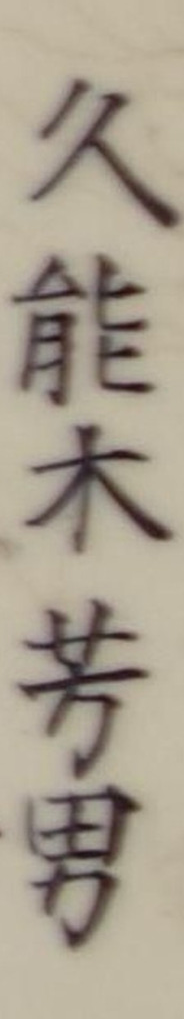久能木芳男
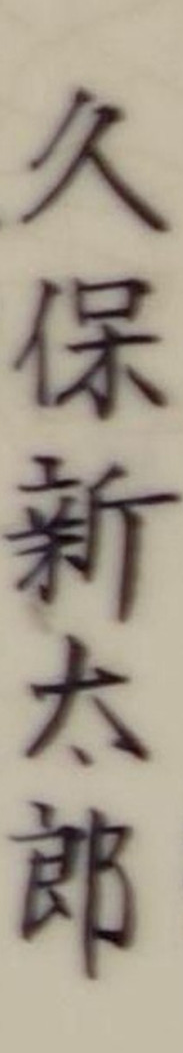久保新太郎
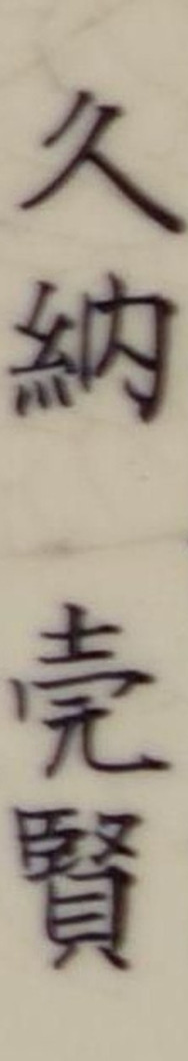久納売賢
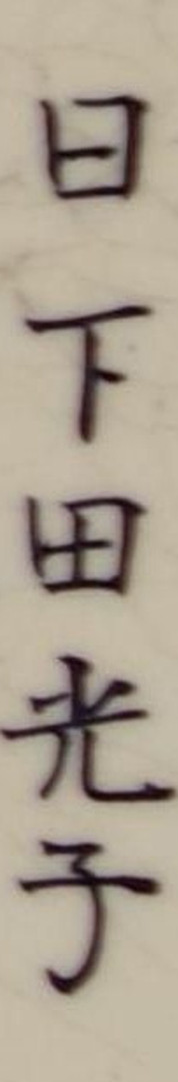日下田光子
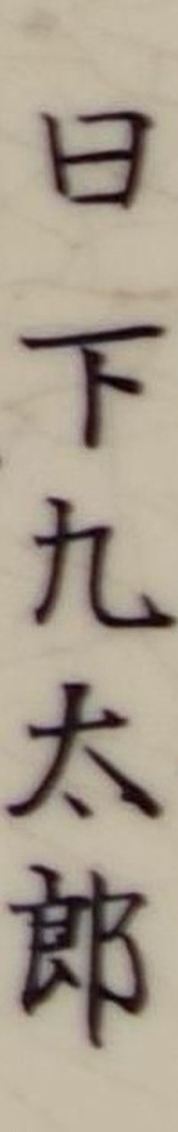日下九太郎
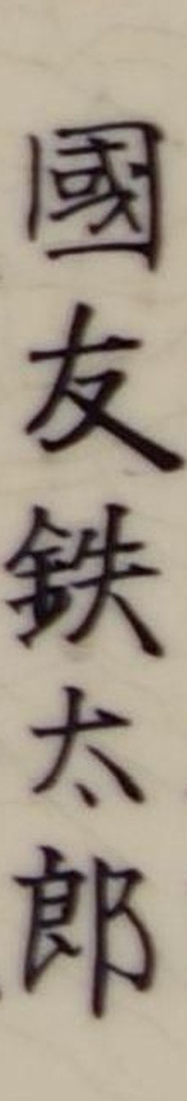國友鉄太郎
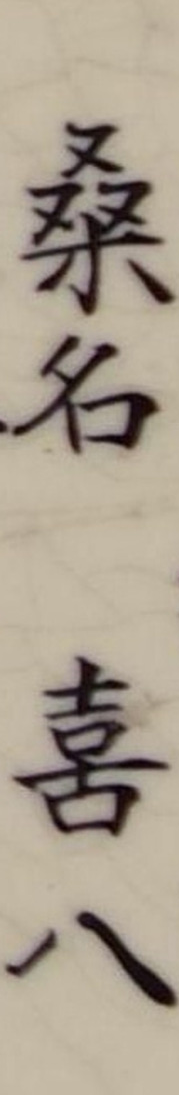桑名喜八
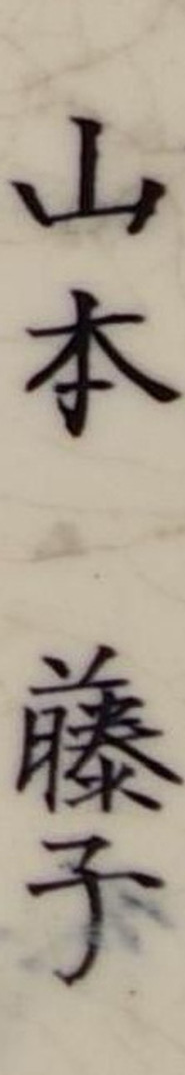山本藤子
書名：M~S
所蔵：高野山金剛峯寺
